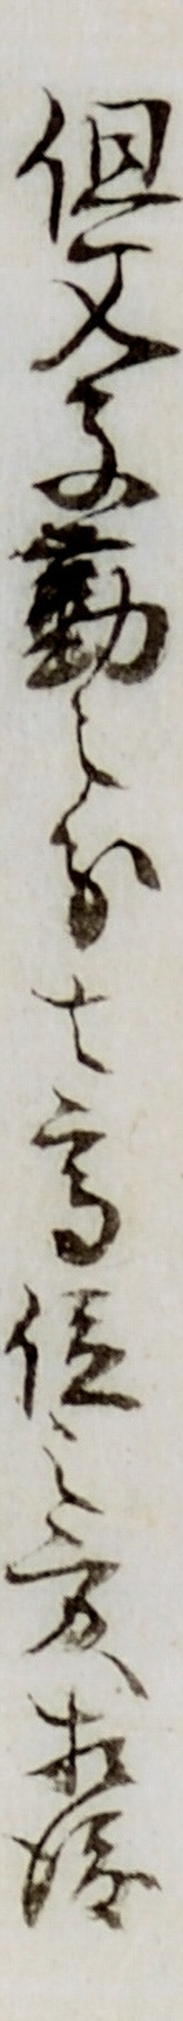但父子勤之分は高位之方へ相渡
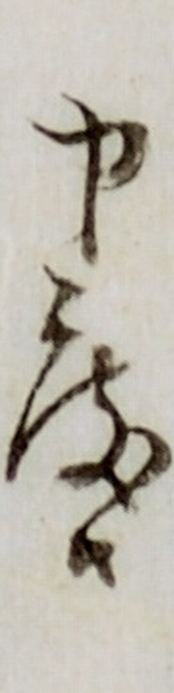申度候
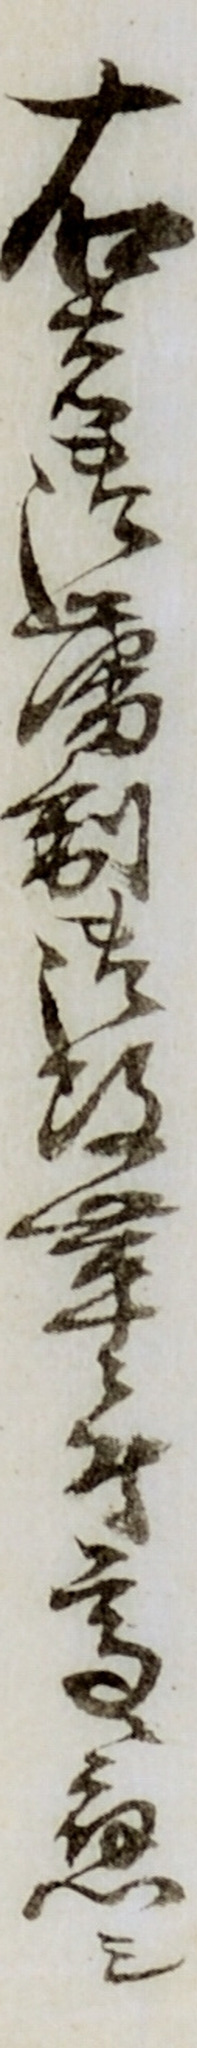右は御藩制御改革に付高に応シ
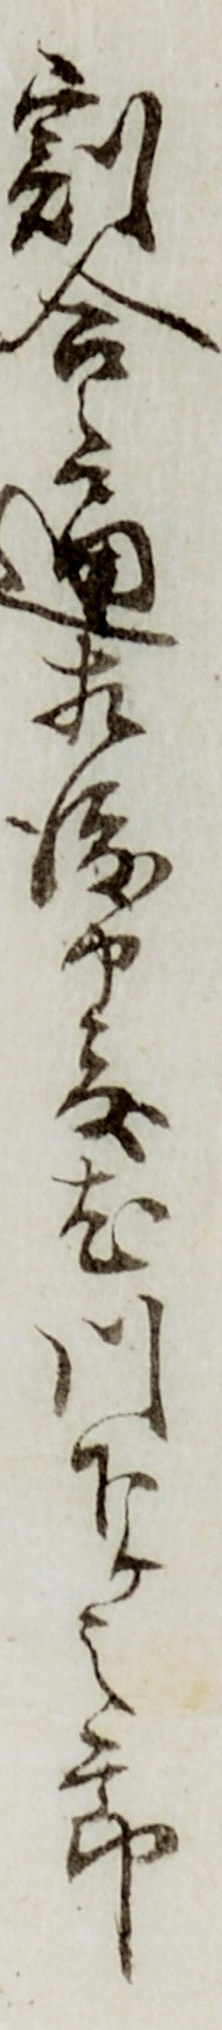割合之通相渡申度尤川下ケ之節
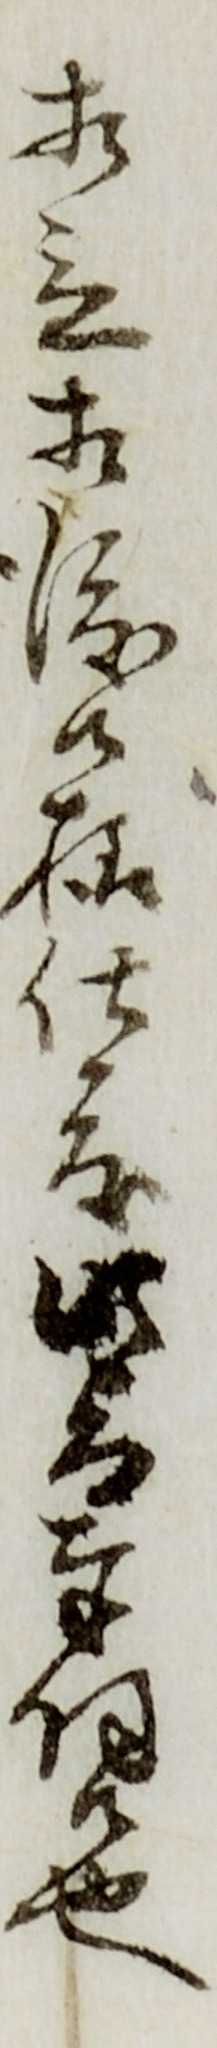相立相渡候様仕度此旨奉伺候也
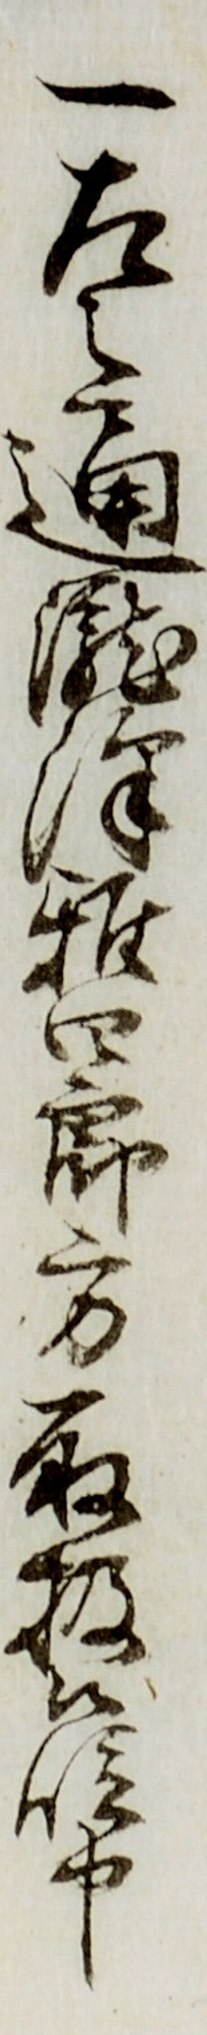一左之通滝沢雅四郎方取扱候段申
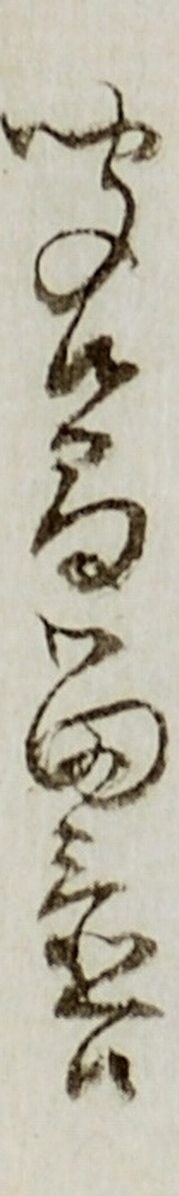聞候間留置候
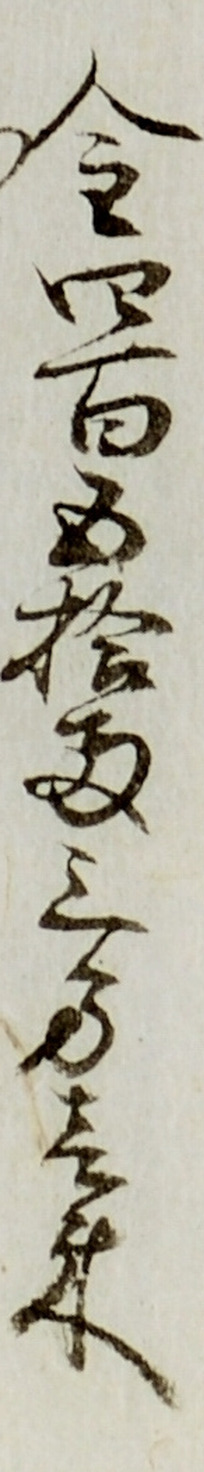一金四百五拾両三分壱朱
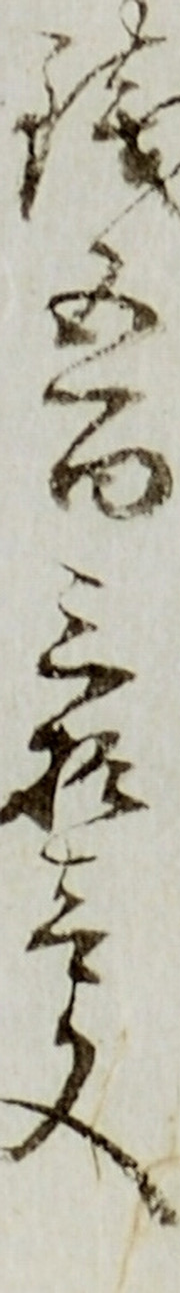銭五百三拾壱文
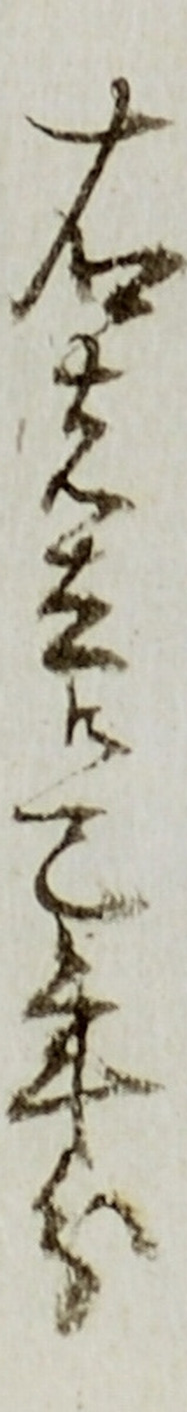右は去ル巳年分
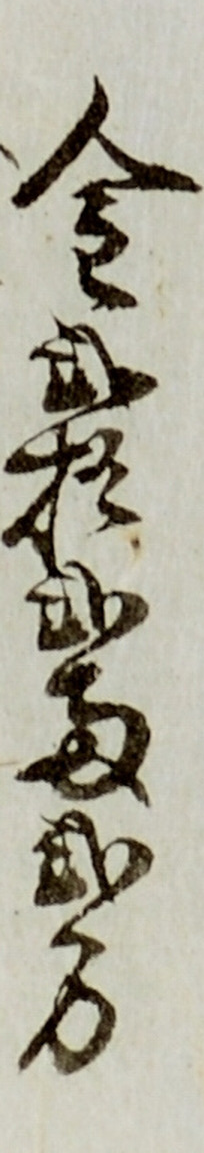一金弐拾弐両弐分
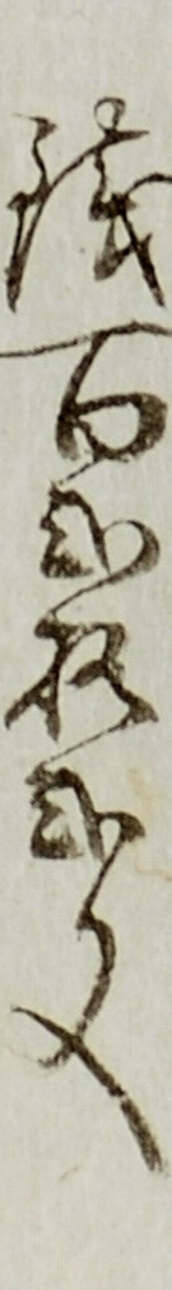銭百弐拾弐文
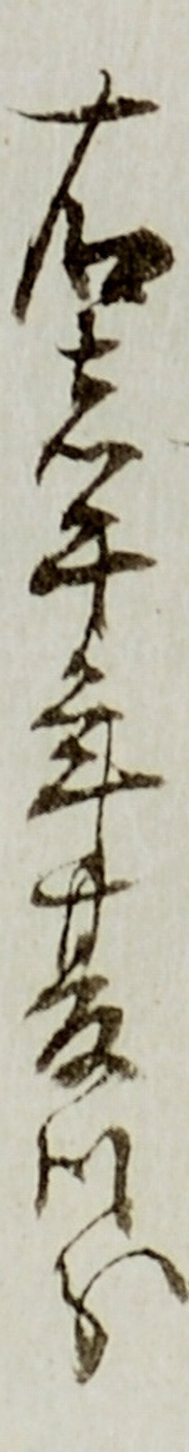右は午年夏川分
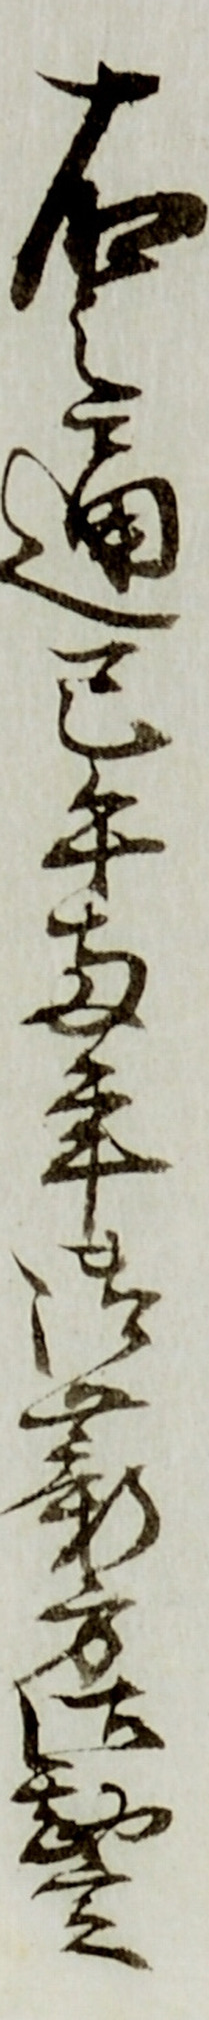右之通巳午両年御薪方御勘定
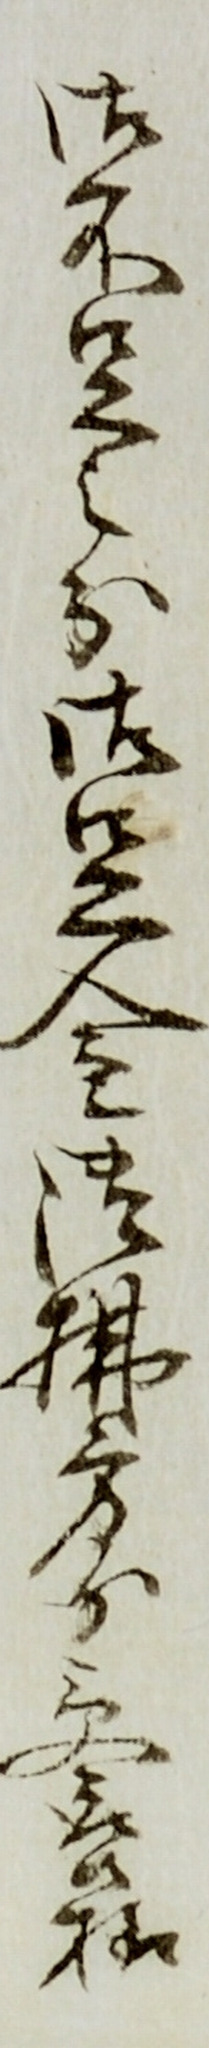御不足之分御足金御払方ゟ受取候様
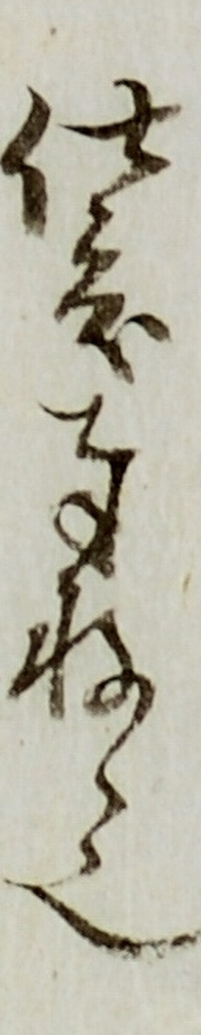仕度奉存候也
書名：山林方諸事御用留
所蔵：伊那市立高遠町図書館・合同会社AMANE
